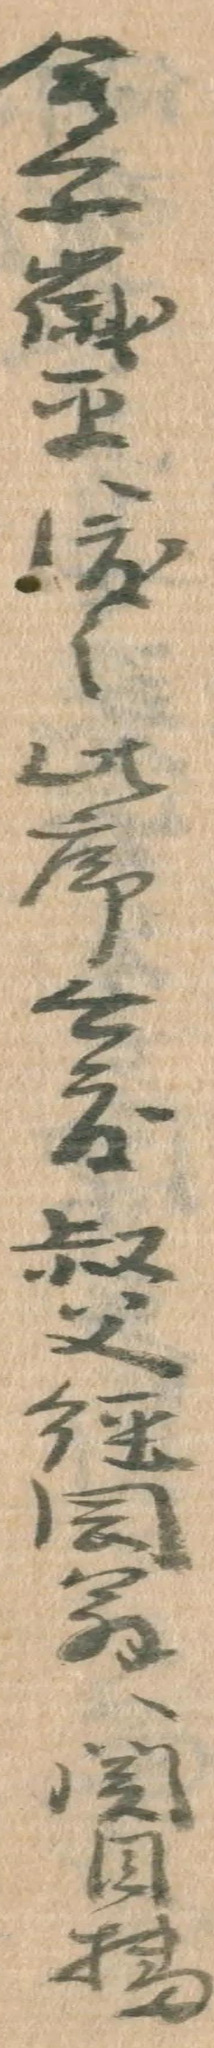會所歳平へ渡之、此序今度叔父経岡翁へ関目播
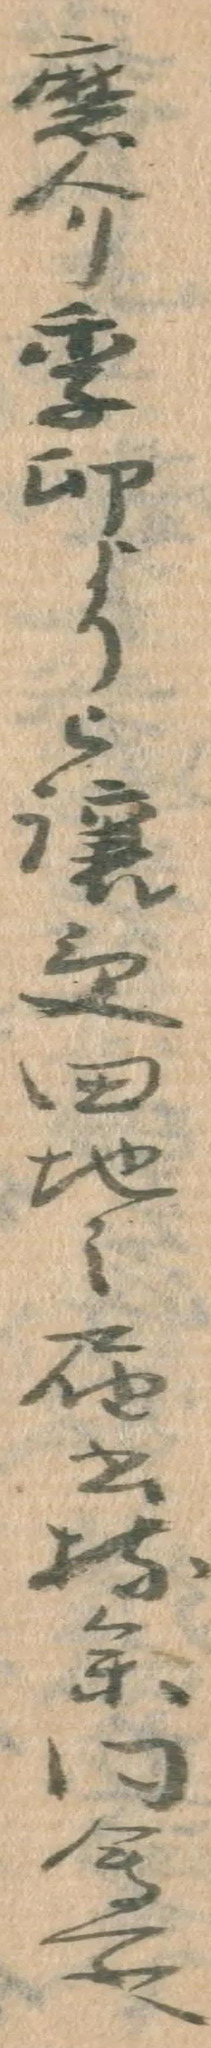磨介季卯より被譲受田地之届書持参、同會所へ
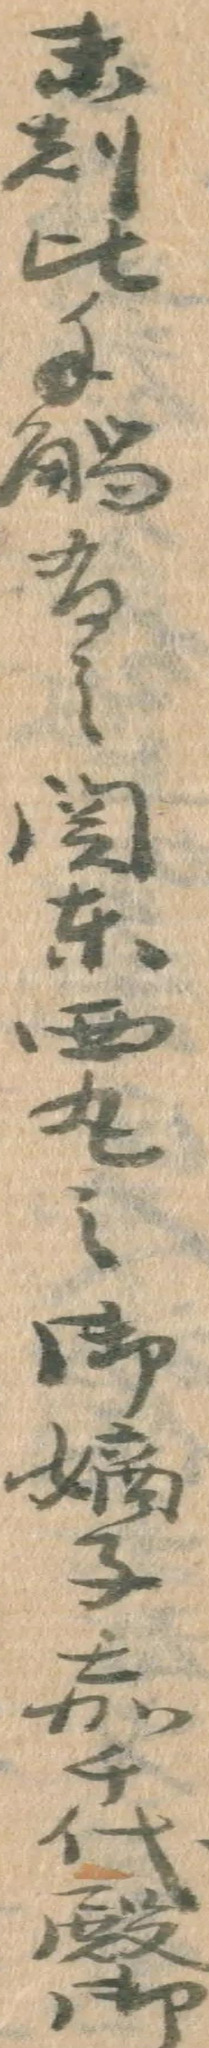未刻比手触有之、関東西丸之御嫡子嘉千代殿御
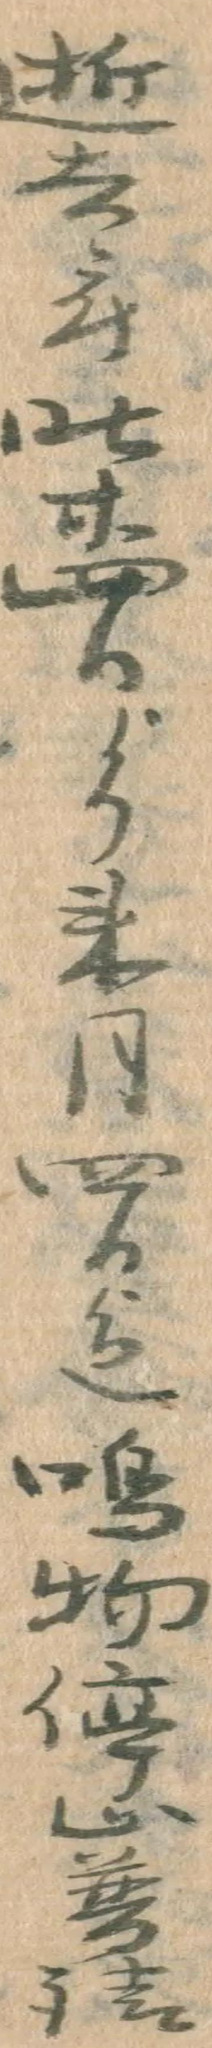逝去ニ付、年廿四日より来月四日迄鳴物停止、普請
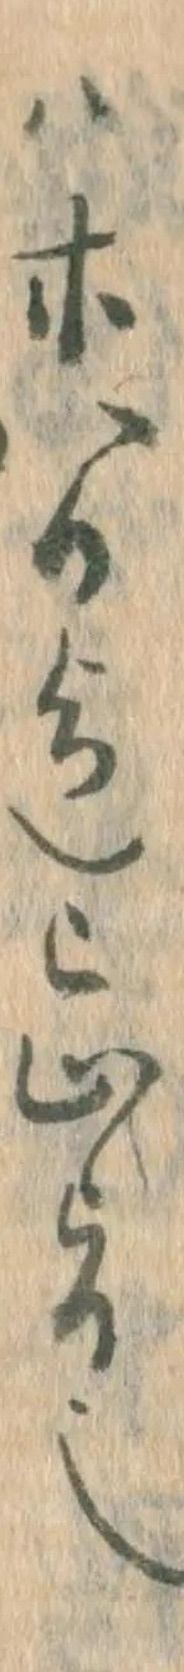ハ廿八日迄被止旨也、
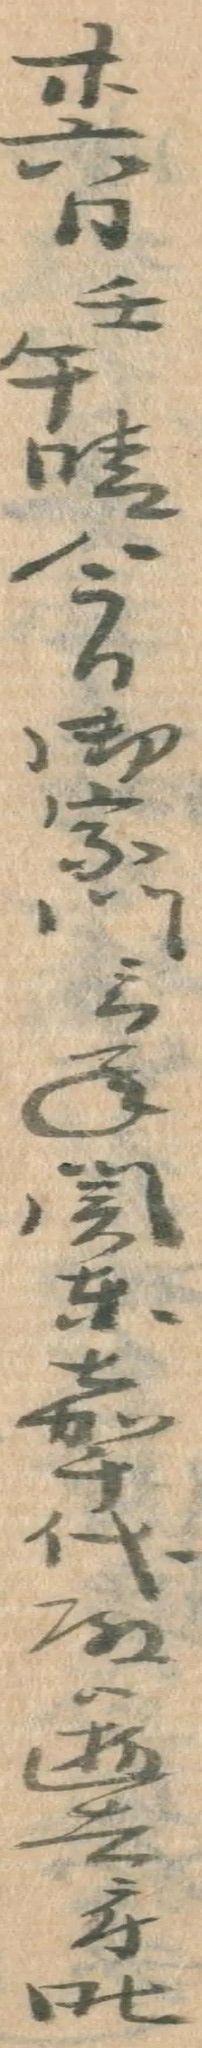廿六日壬午晴、今日御家門ニ而、年関東嘉千代殿ハ逝去ニ付、昨
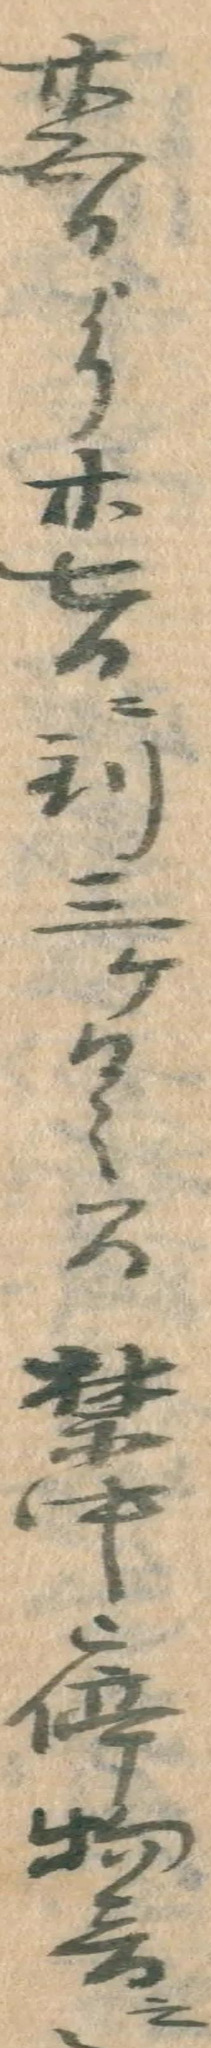廿五日より廿七日ニ到、三ケ日之間禁中被停物音云々、
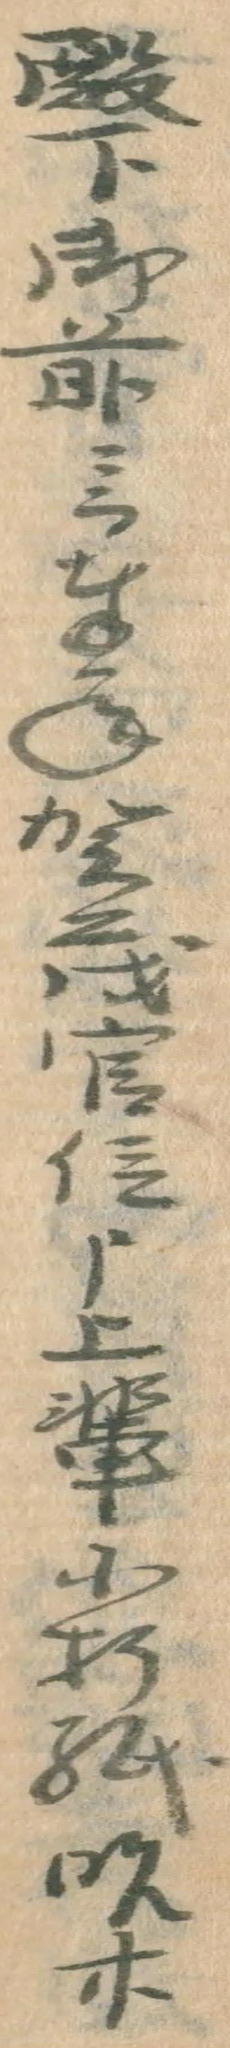殿下御前ニ而奉承、賀茂官位申上輩小折紙昨廿

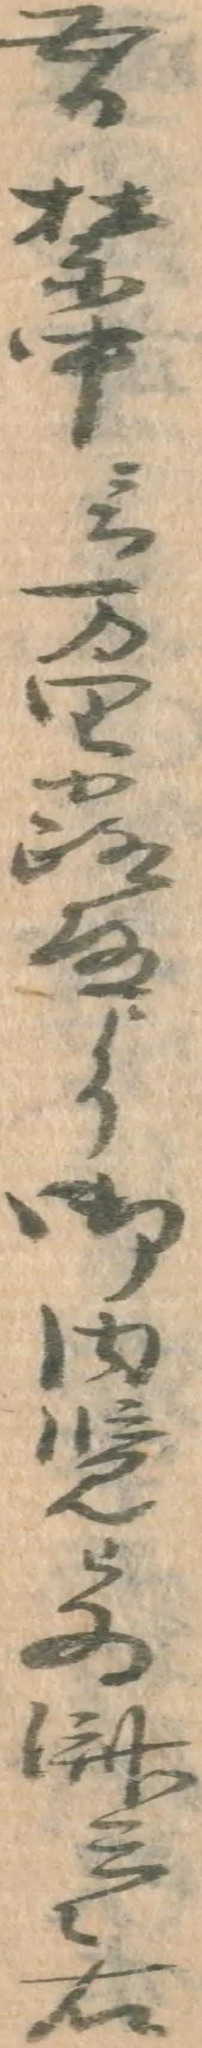五日禁中ニ而万里小路殿より御内覧被為済云々、右
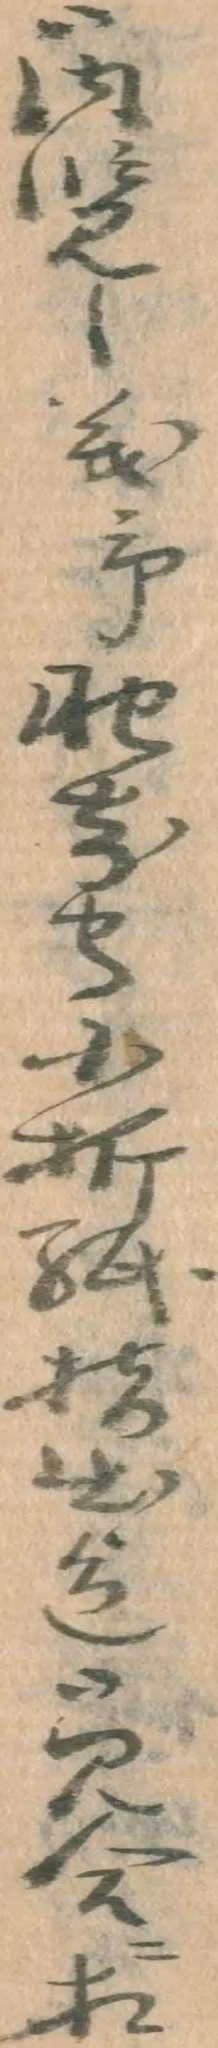御内覧之義、予肥前守小折紙指出迄御見合に相
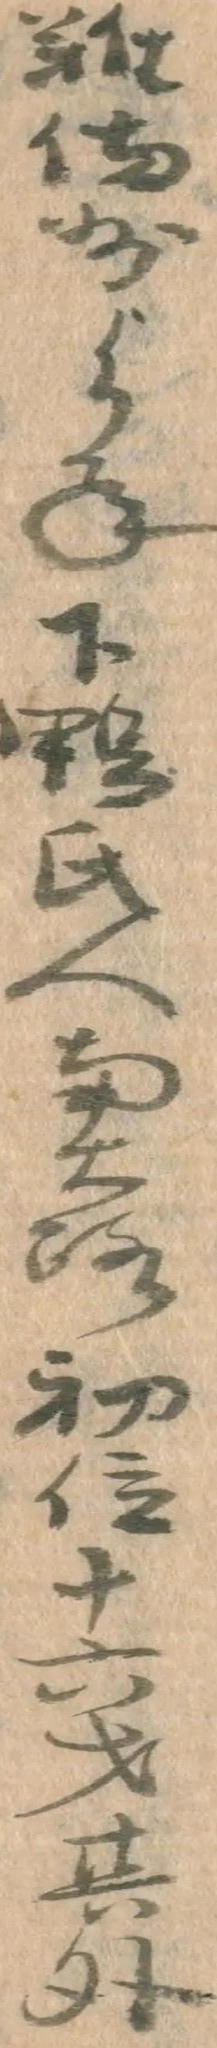難備州より承、下野氏人南大路初位十六才、其外
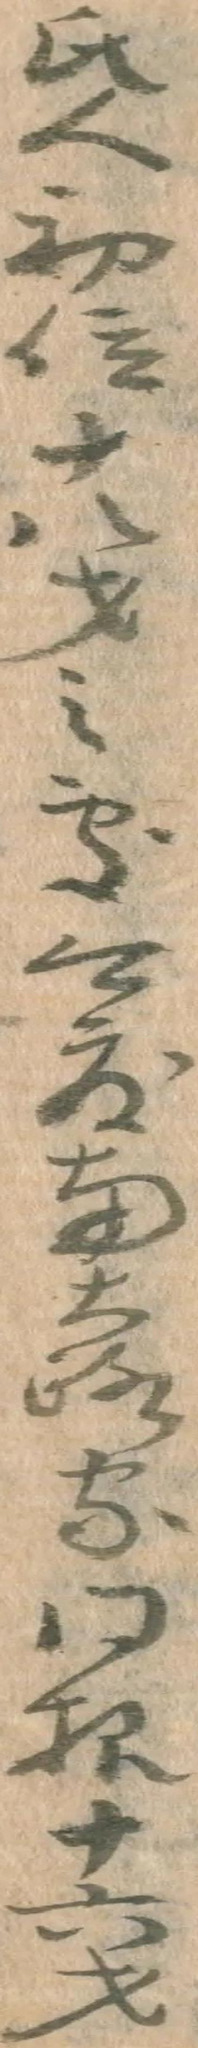氏人初位十八才之處、今度南大路家同様十六才
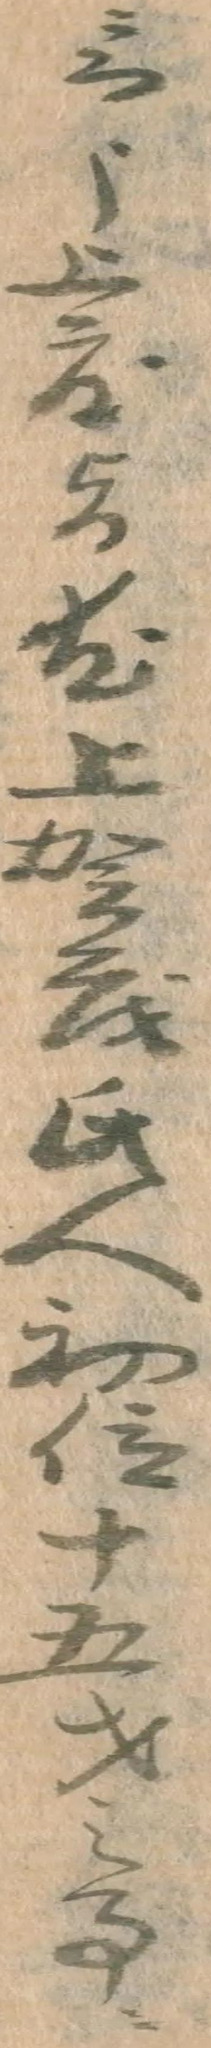ニ而申上度旨、尤上賀茂此人初位十五才之事ニ
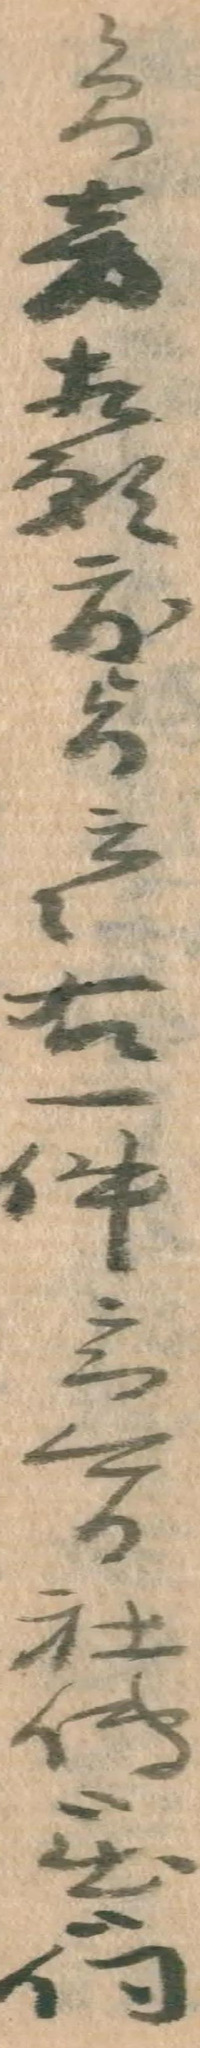候間、旁相願度旨云々、右一件ニ而、今日社傳御出御伺
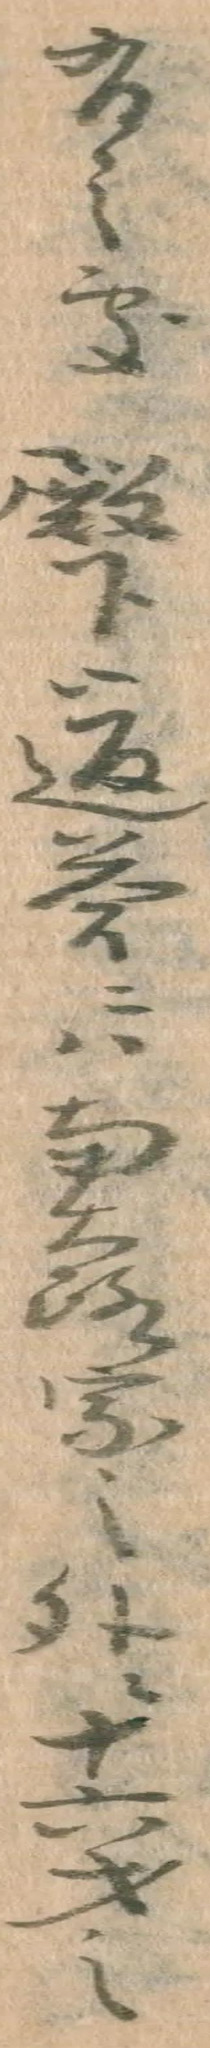有之處、殿下御返答ニハ、南大路家之外ニ十六才之
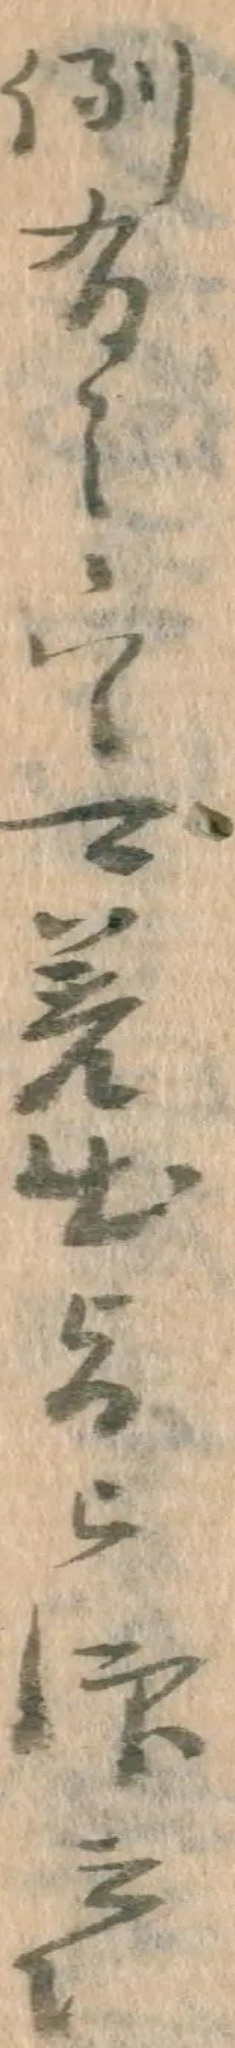例有之候ハヽ、可差出旨被仰云々、
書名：賀茂社記録. 第63冊
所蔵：国立国会図書館 National Diet Library, JAPAN
